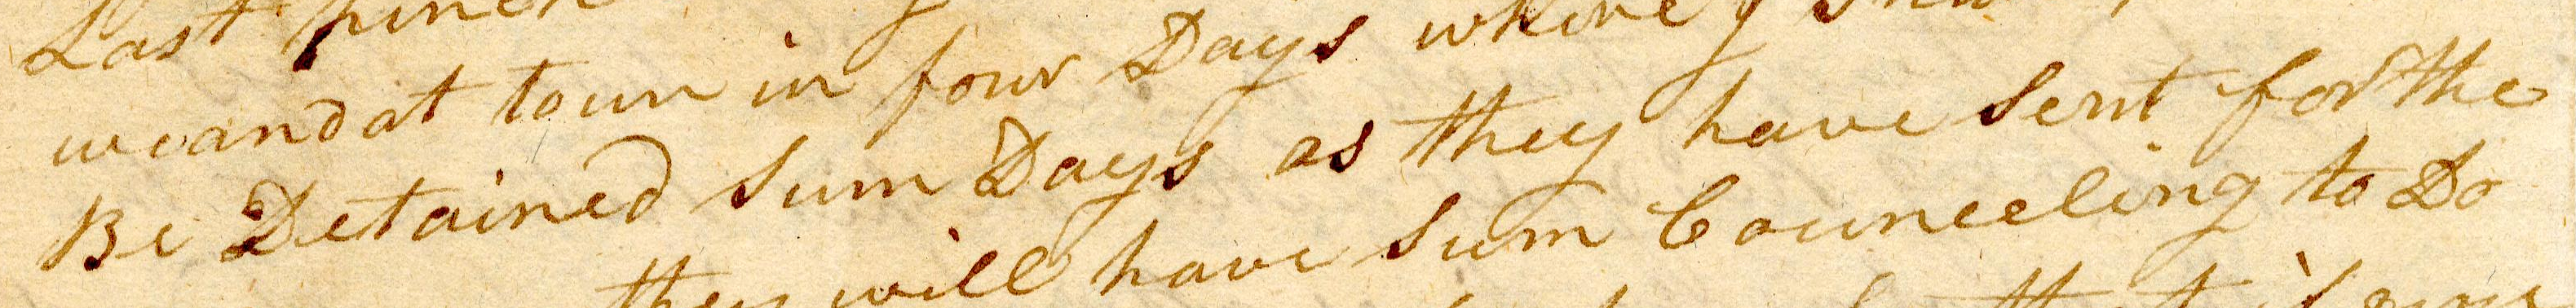Be Detained Sum Days as they have sent for the
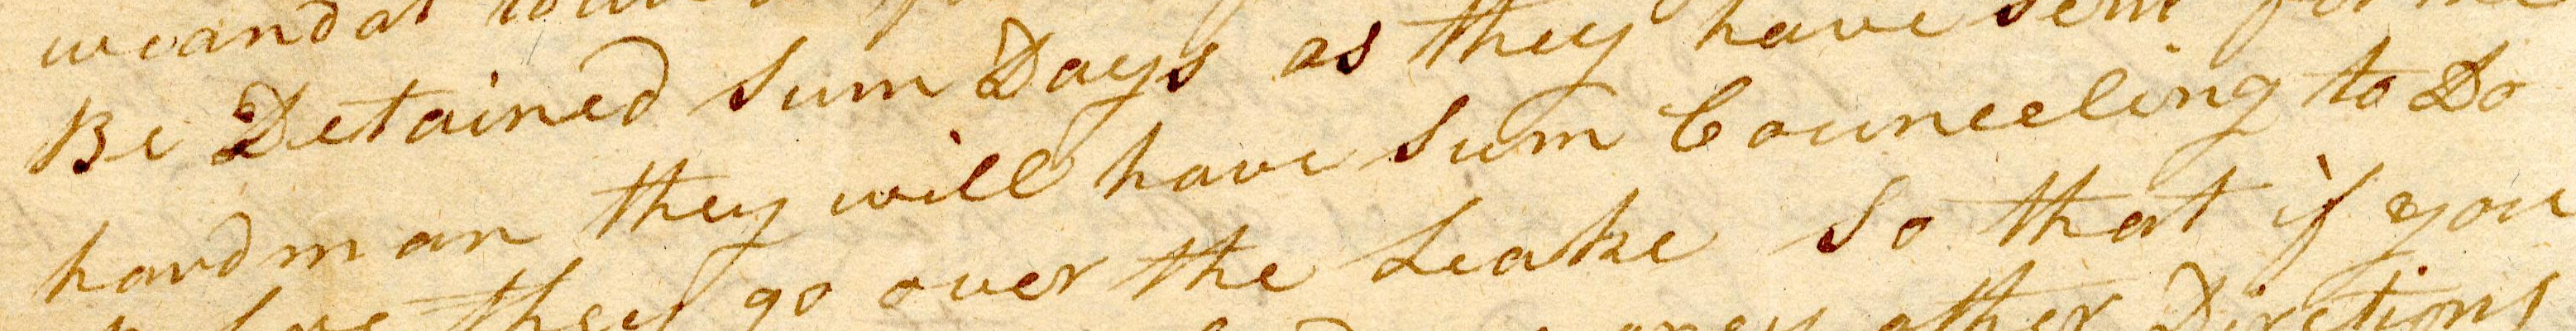hand man they will have Sum Counceling to Do
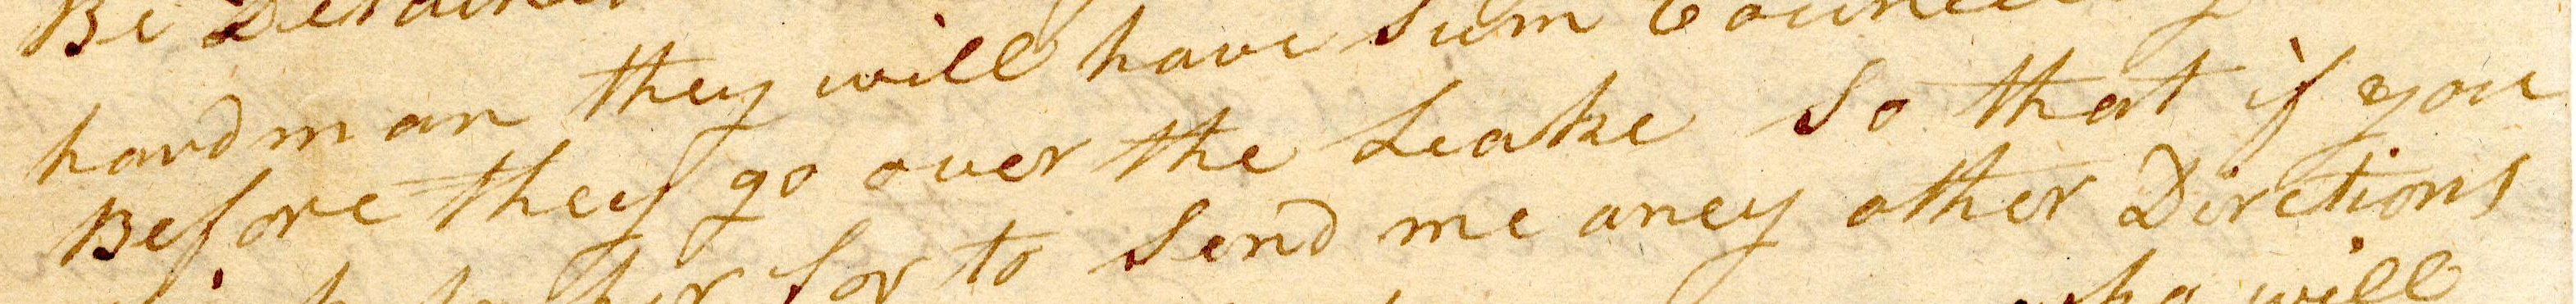Before they go over the Leake So that if you
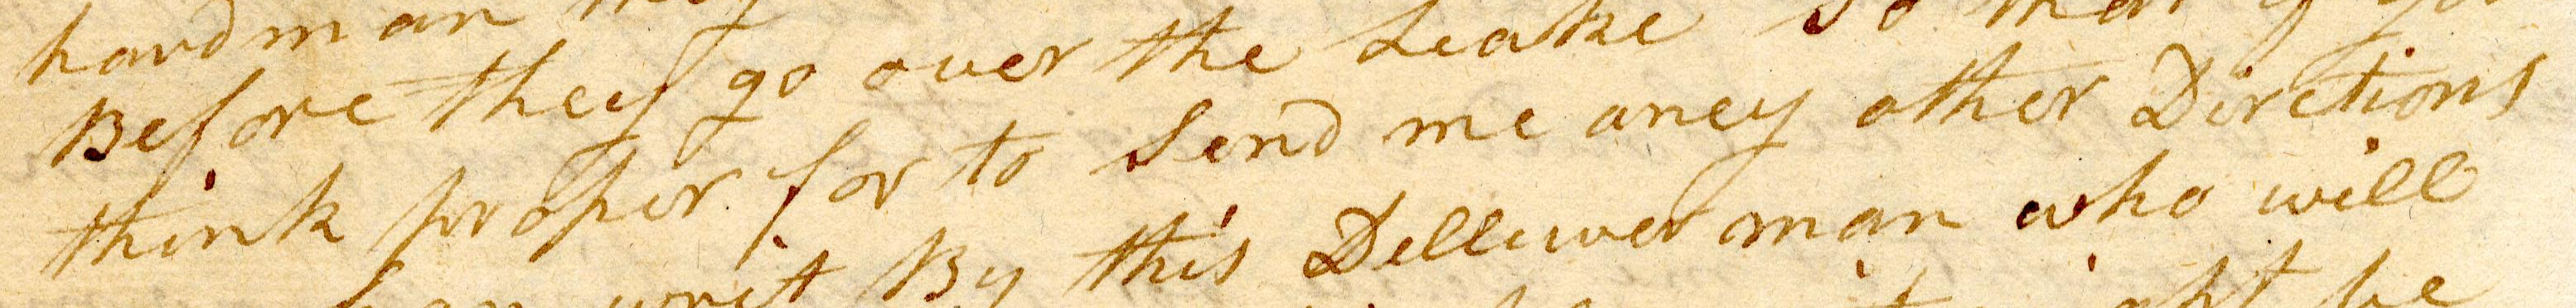think proper for to Send me aney other Directions
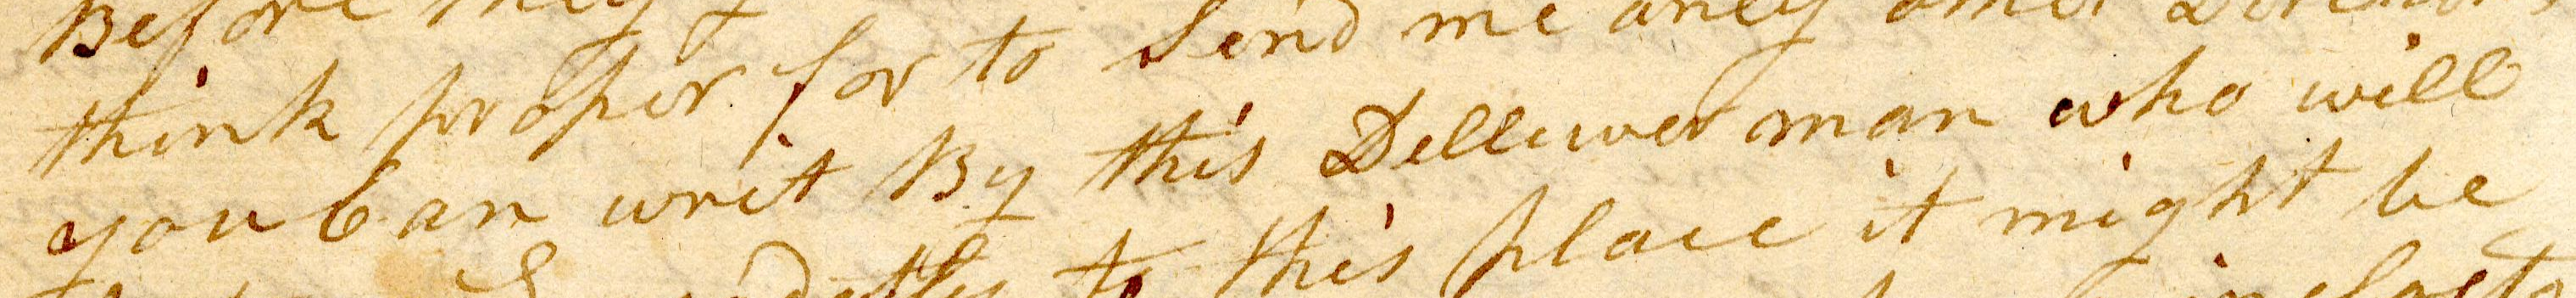you can writ By this Dellewer man who will
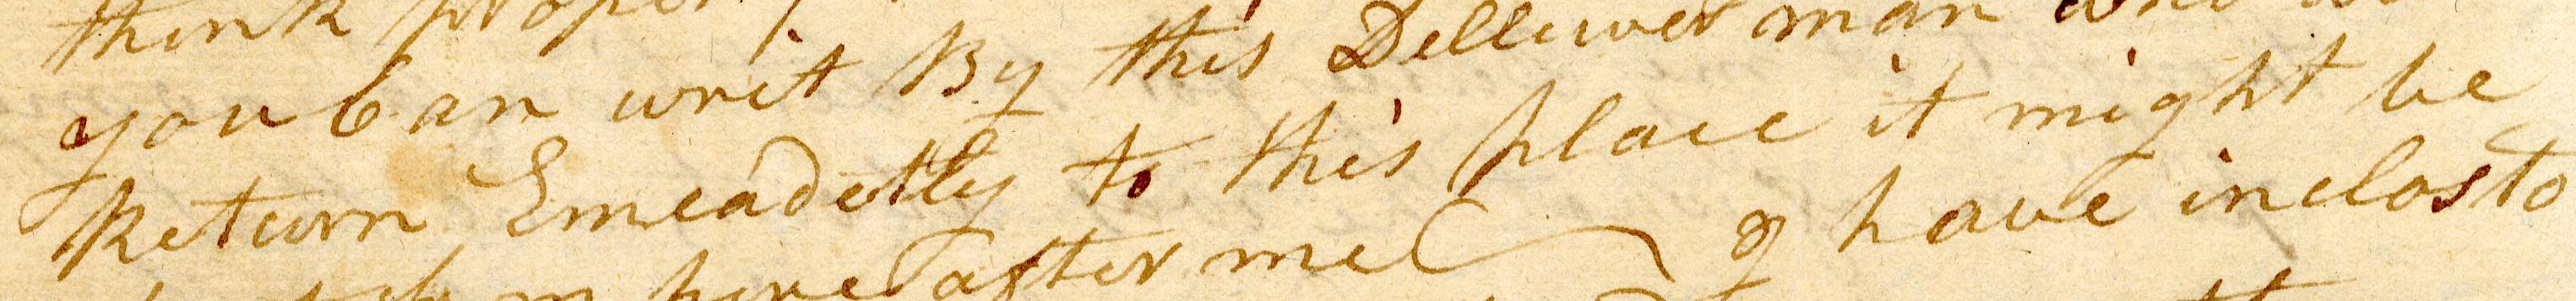Return Emeadetly to this place it might be
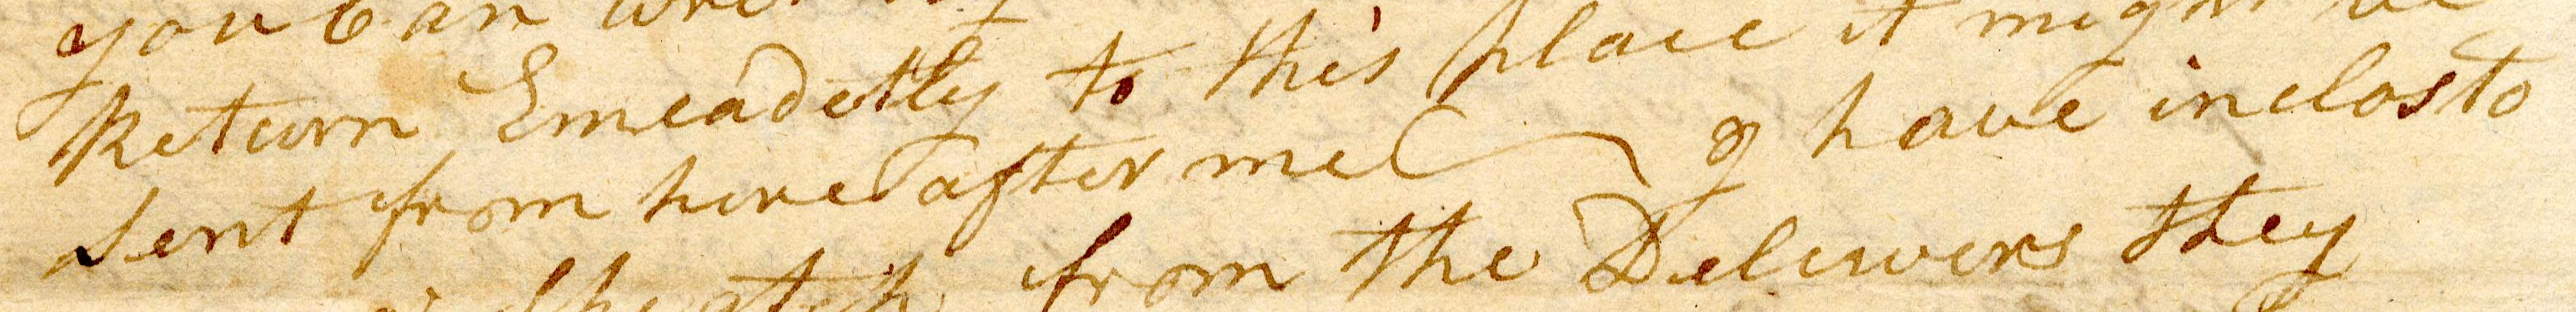sent from here after me- I have inclos to
